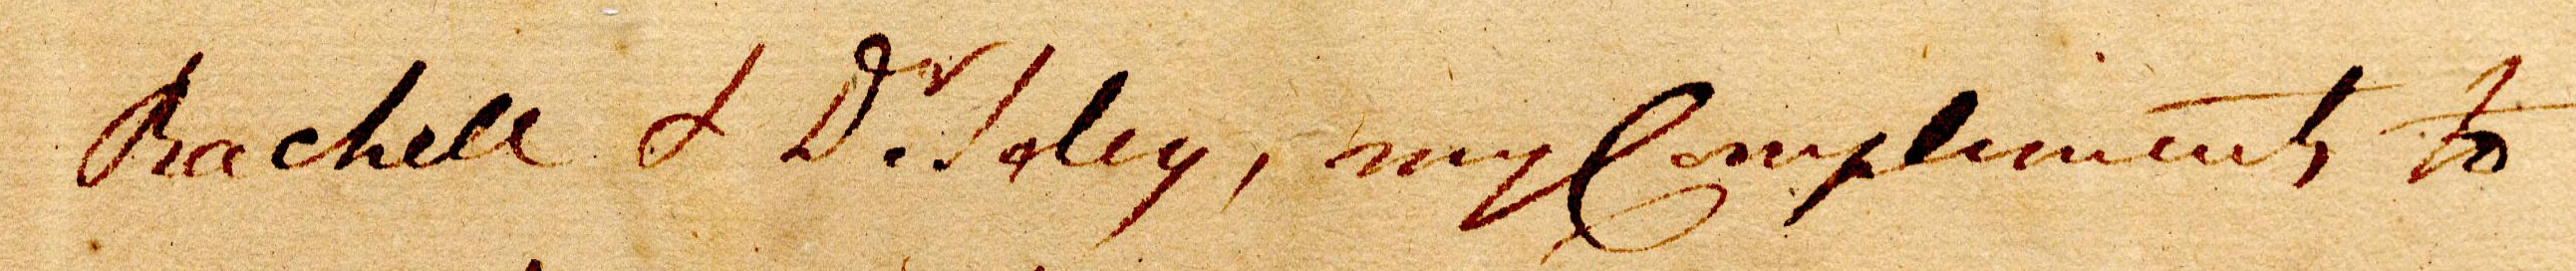Rachael & D^r Haley, my Compliments to
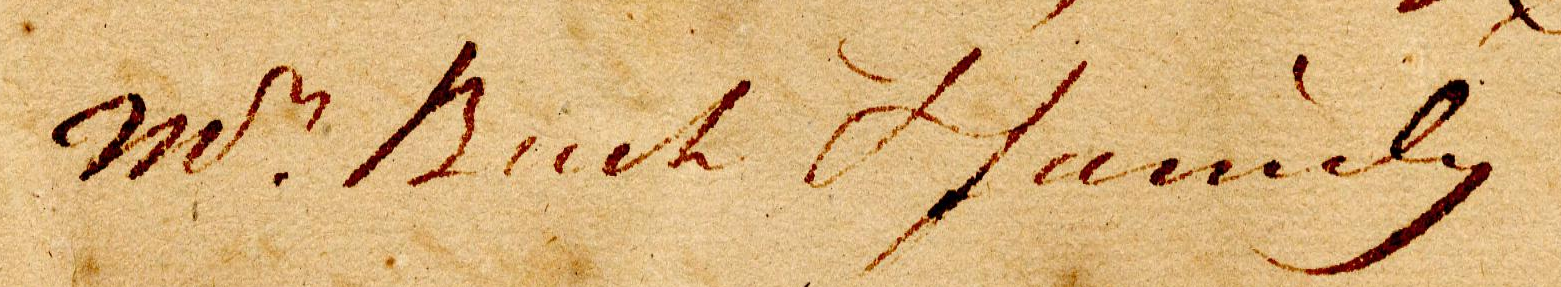M^r Birch Family
